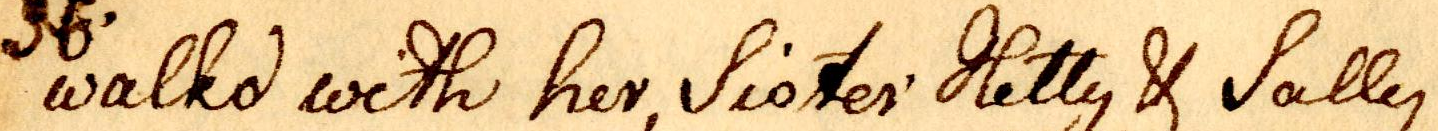walkd with her, Sister Hetty & Sally
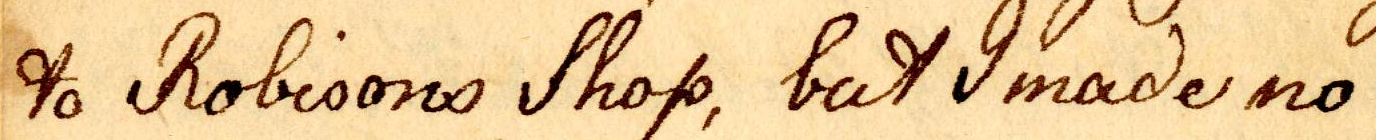to Robinsons Shop, but I made no
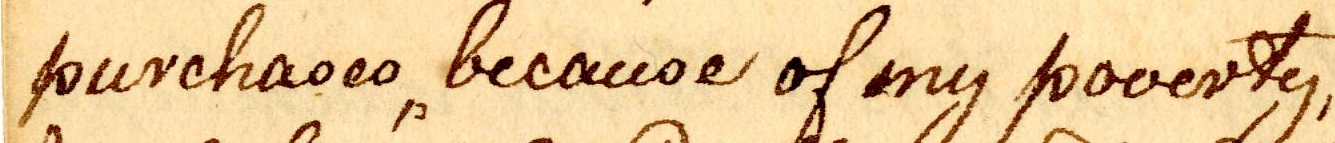purchases because of my poverty,
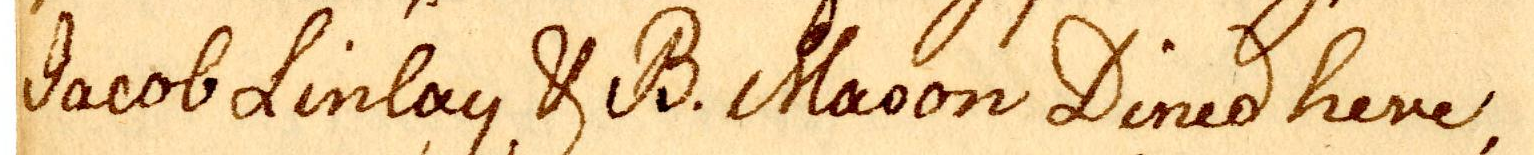Jacob Linlay & B. Mason Dined here,
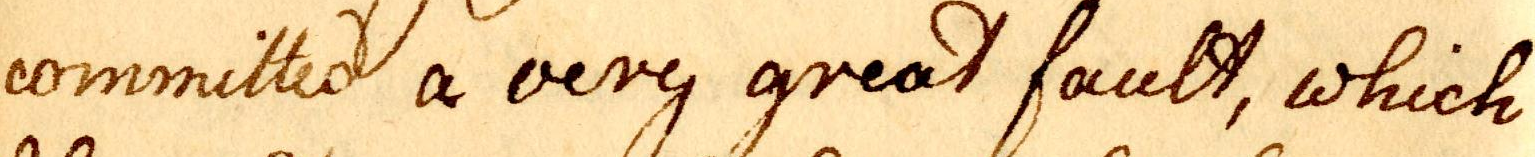committed a very great fault, which
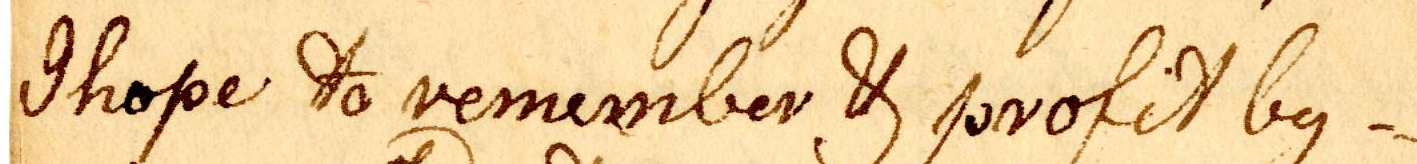I hope to remember & profit by-
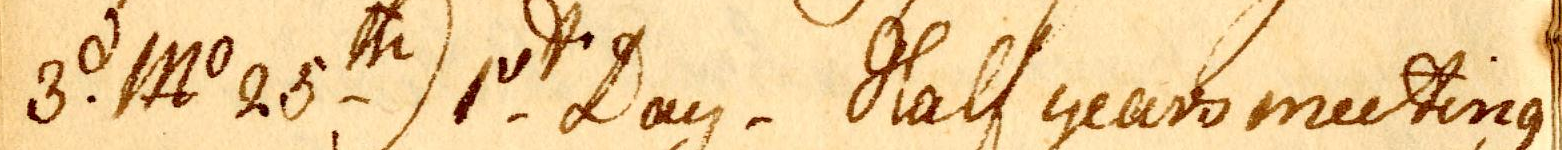3^d M^o 25^th) 1^st Day- Half years meeting
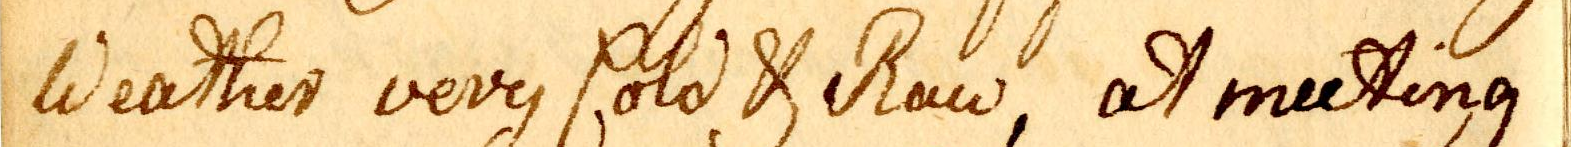Weather very Cold & Raw, at meeting
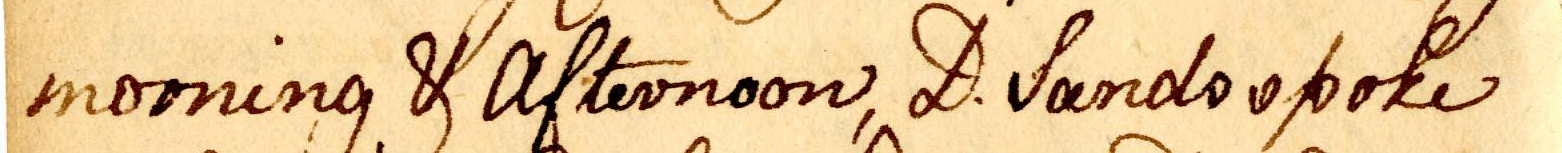morning & Afternoon, D. Sands spoke
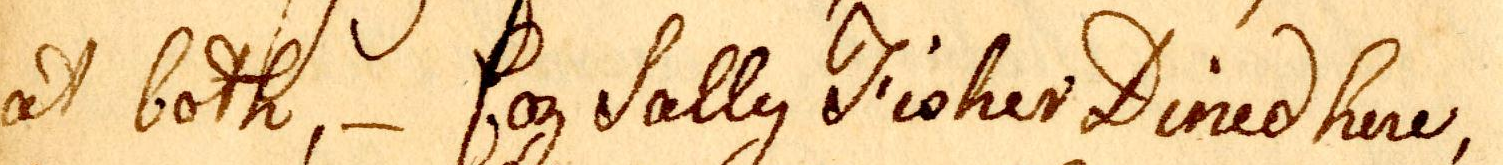at both,- Coz Sally Fisher Dined here,
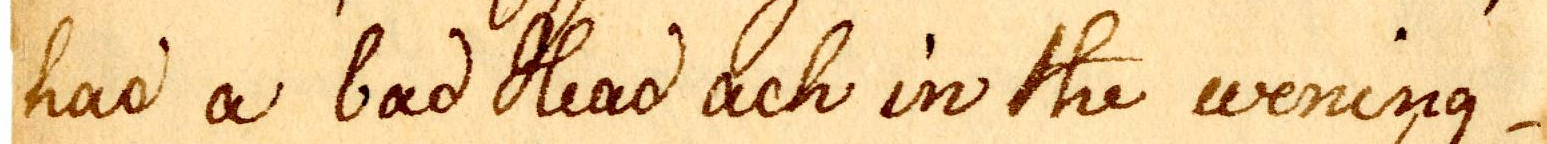had a bad Head ach in the evening-
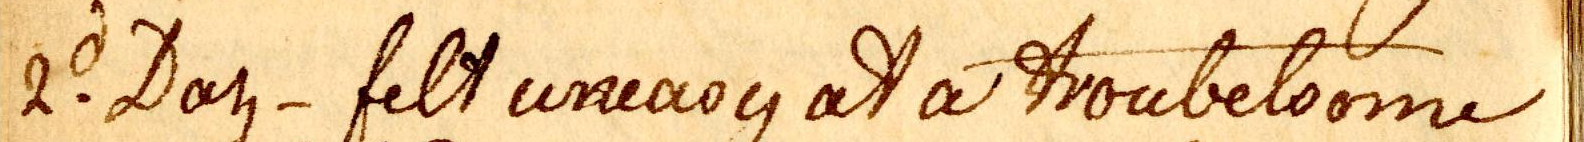2^d Day- felt uneasy at a troubelsome
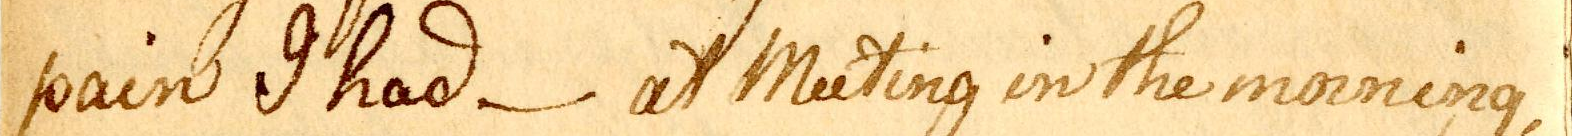pain I had- at Meeting in the morning,
